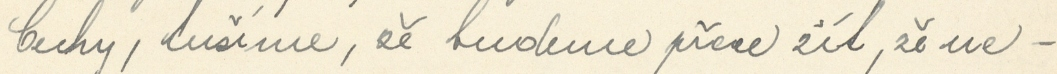Čechy, tušíme, že budeme přece žít, že ne-
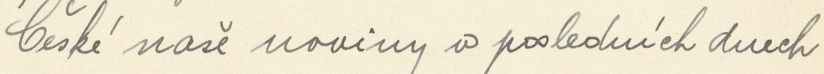České naše noviny v posledních dnech
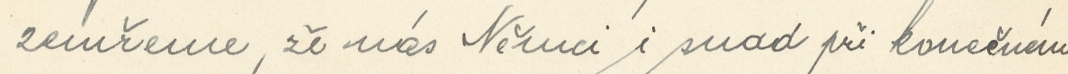zemřeme, že nás Němci i snad při konečném
